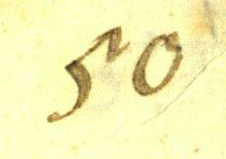50
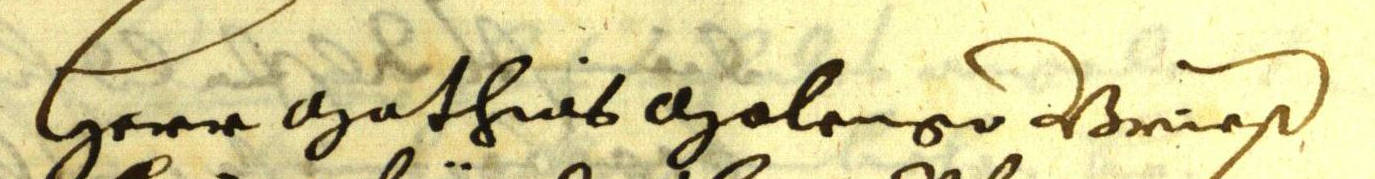Herr Mathias Malengo Briest
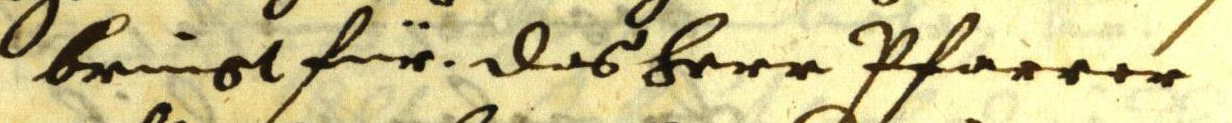bringt für. das herr Pfarrer
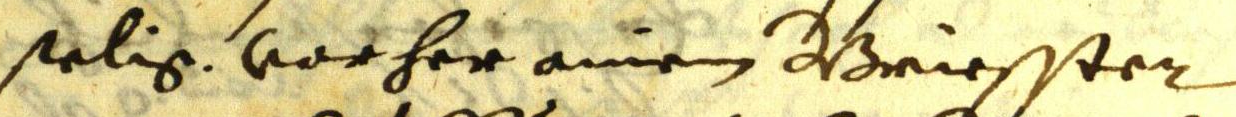selig. vorher ainem Briesster
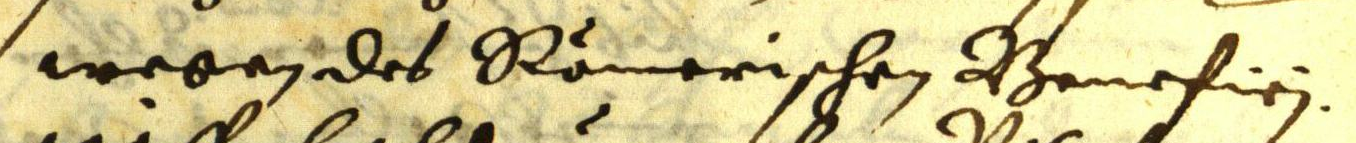wegen des Römerischen Beneficj.
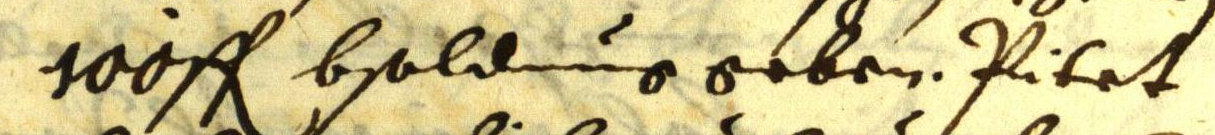100 fl bsoldūng geben. Pitet
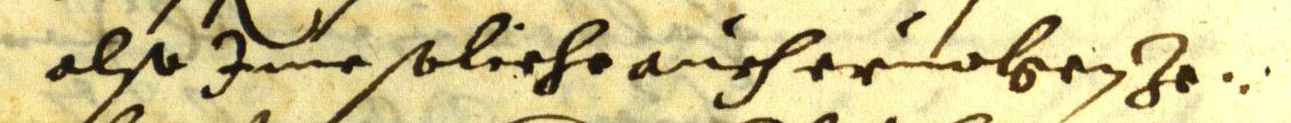also Ime soliche aūch erūolgen Ze¬
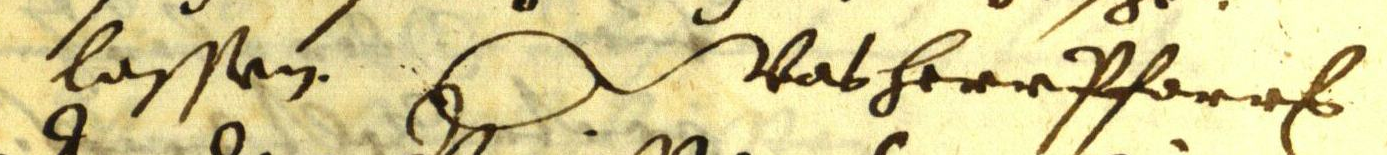lassen. Was herr Pfarrer
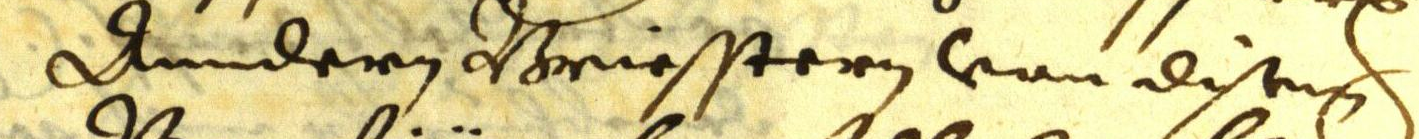Anndern Briesstern von disem
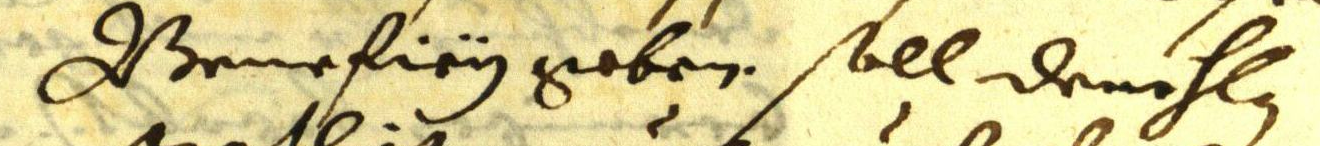Beneficÿ geben. soll dene hln
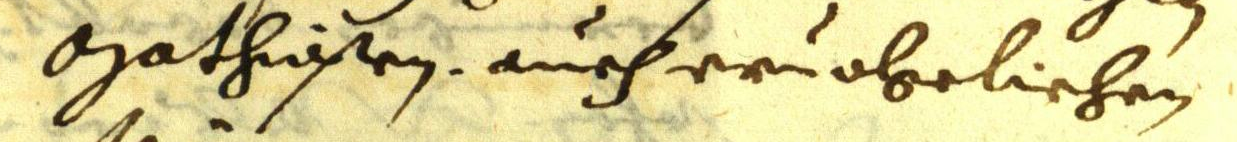Mathiasen. aūch erūolgelichen
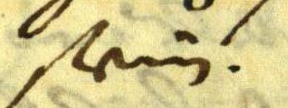sein.
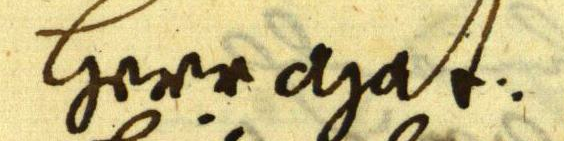Herr Mat¬
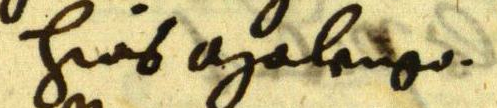hias Malengo
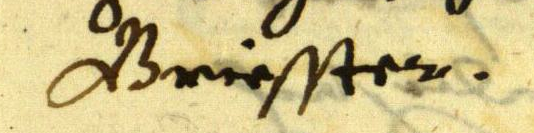Briesster.
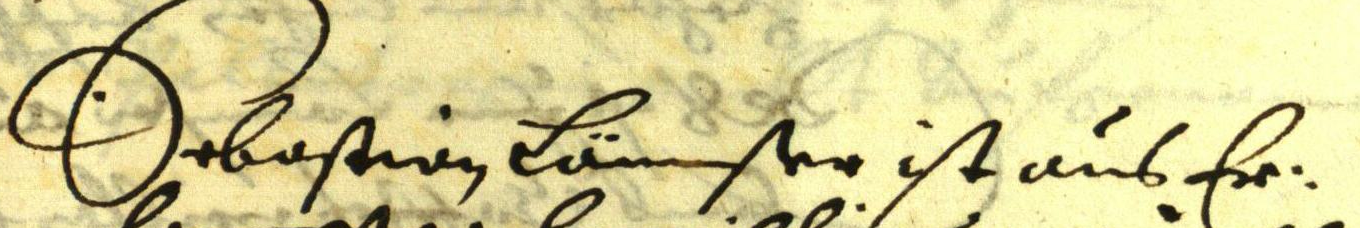Sebastian Lännser ist aūs Er¬
